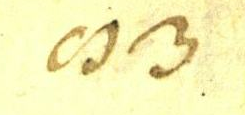83
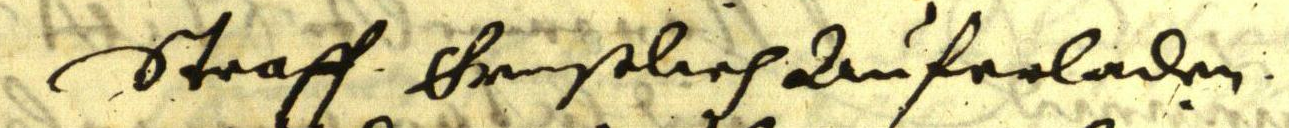Straff Ernstlich Aūferladen.
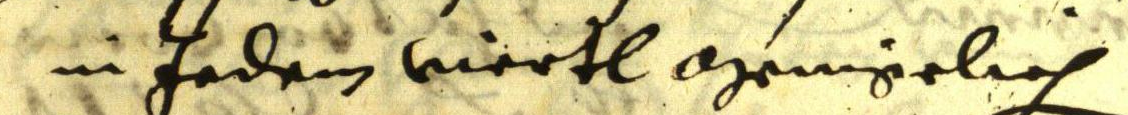in Jedem viertl Menigelich
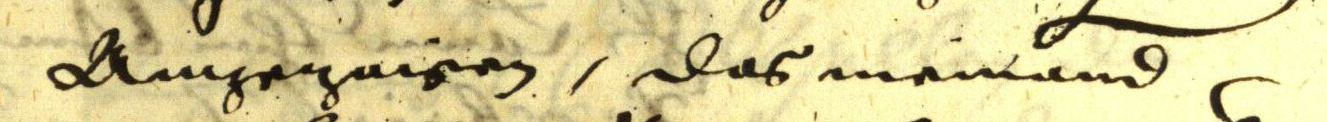Anzezaigen, das niemand
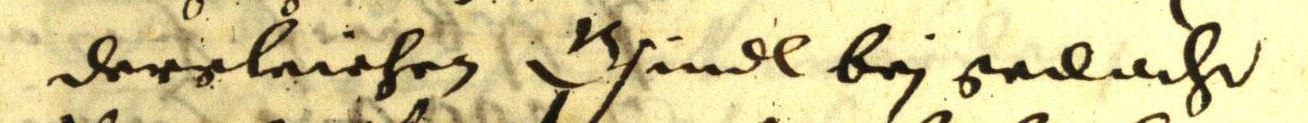dergleichen Gsindl bej gedacht
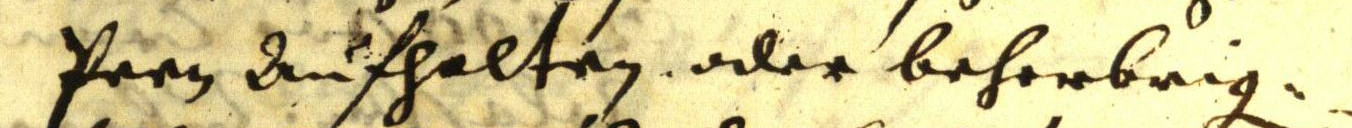Peen Aūfhalten. oder beherbrig
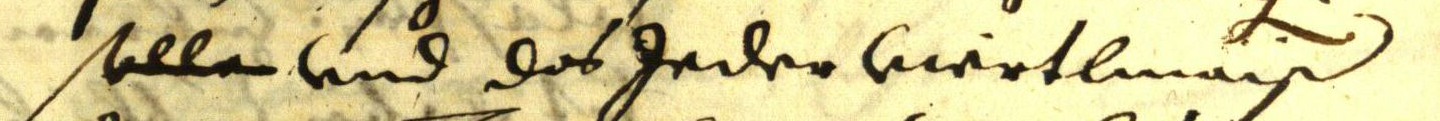solle vnd das Jeder viertlmaist
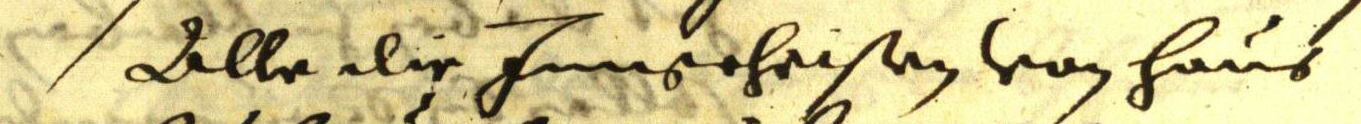Alle die Inngeheisen von haūs
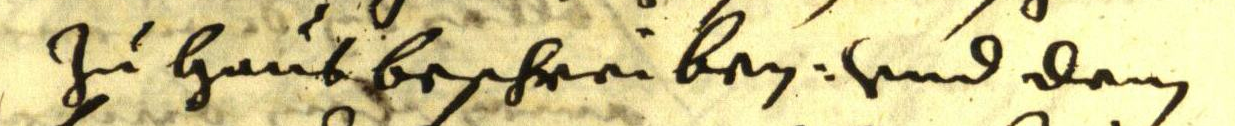Zū haūs beschreiben: vnd dem
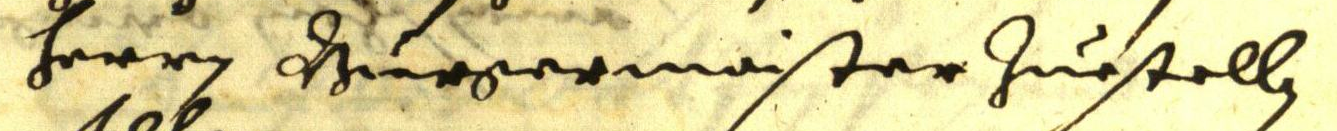herrn Būrgermaister Zūestelln
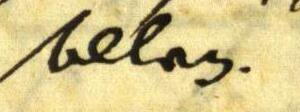sollen.
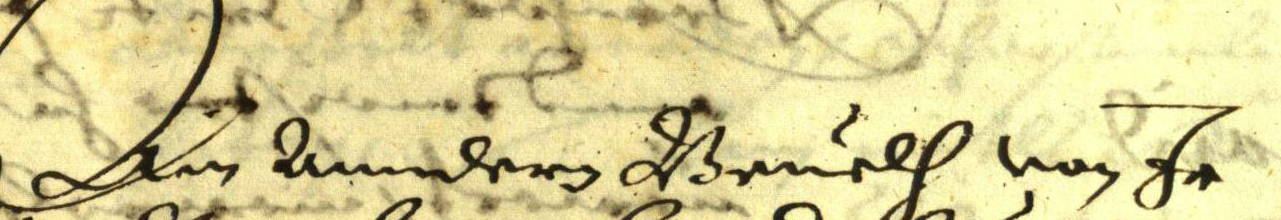Ain Anndern Beūelh von Ir
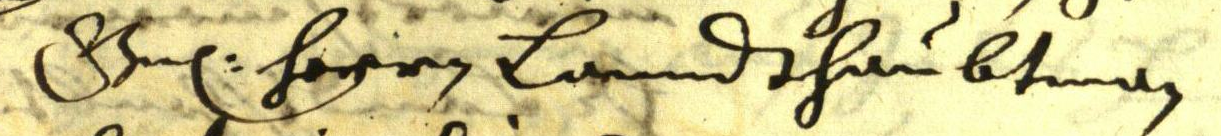Gn: herrn Lanndthaūbtman
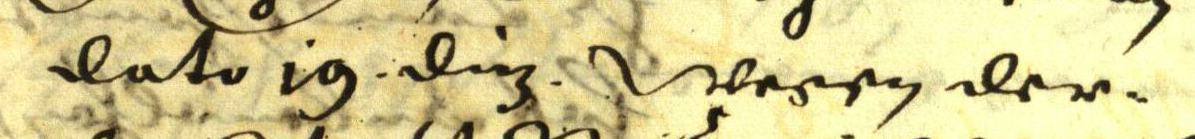dato 19. diz. Wegen der.
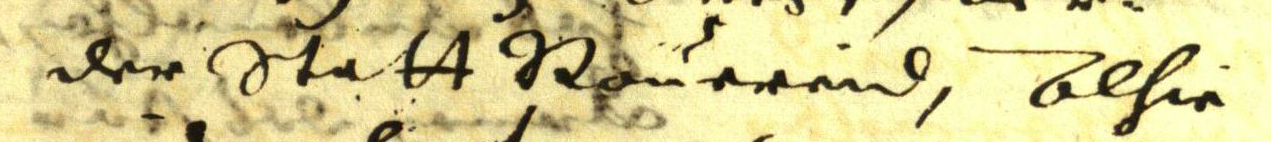der Statt Roūereid, Alhie
